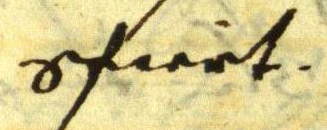gfiert.
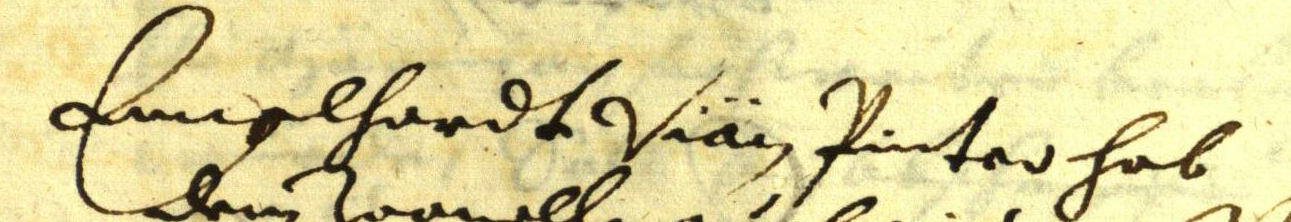Ennglhardt Viän Pinter hab
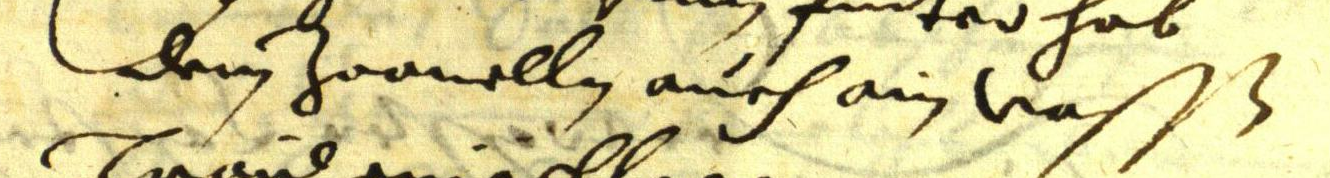dem Zoanelln aūch ain vasß
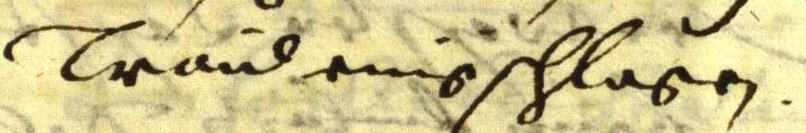Traid eingschlagen.
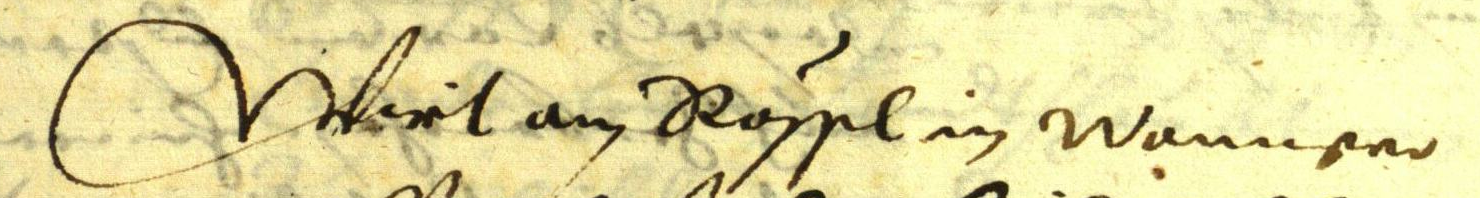Wirt am Rōssl in Wannger
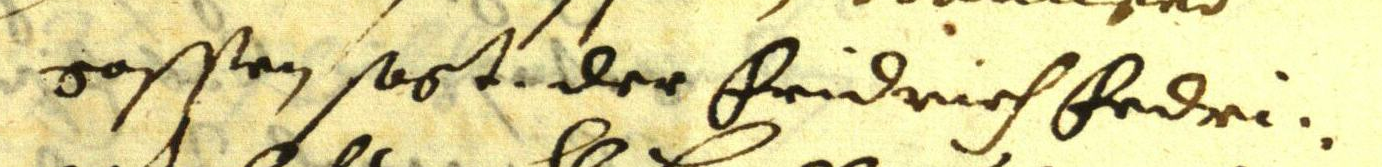gassen sagt. der Fridrich Fedri¬
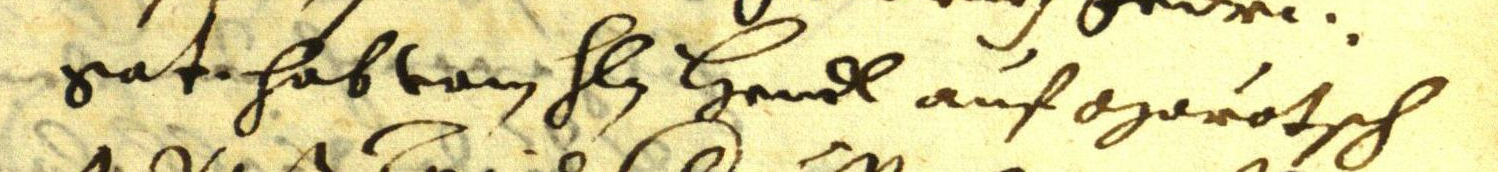gat. hab vom hln Hendl aūf Marōtsch
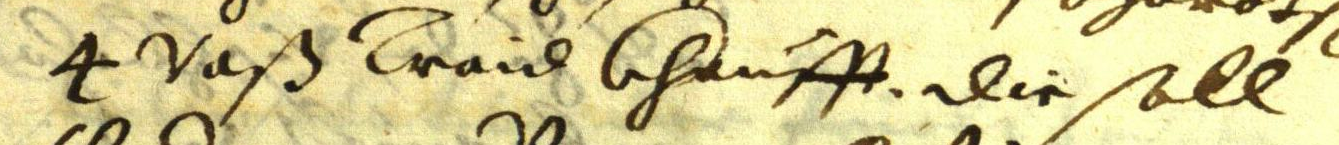4 Vaß Traid khaūfft. die soll
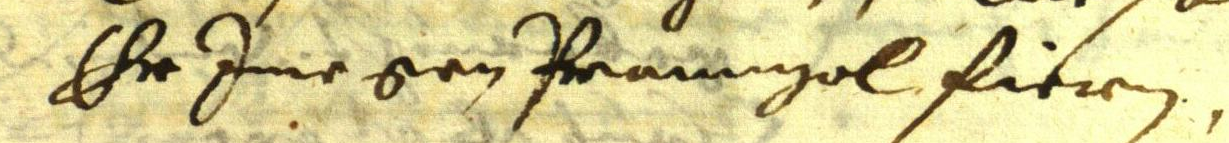Er Ime gen Prannzol fiern,
